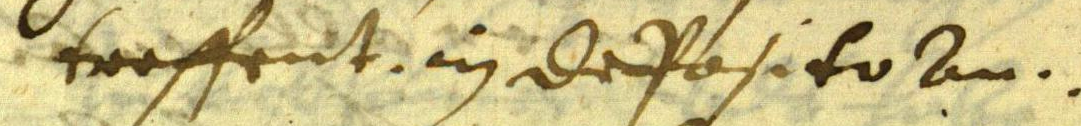treffent. in dePosito An¬
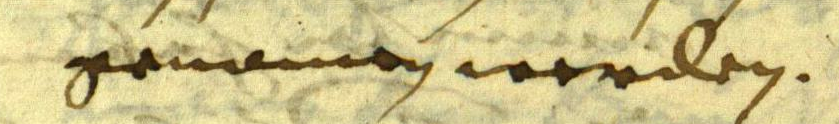genomen werden.
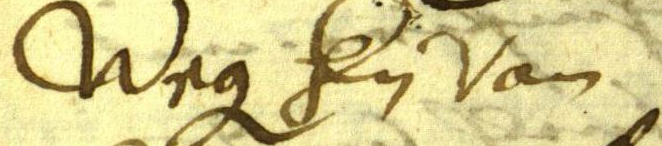Weg hn Von
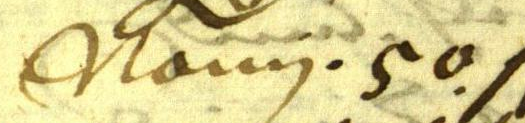Nomi. 50 fl
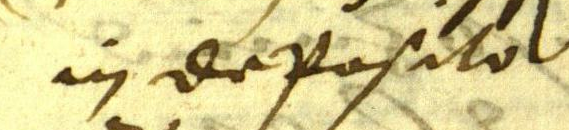in dePosito
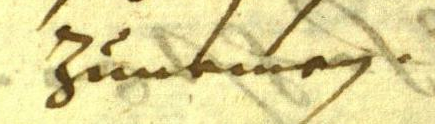Zūnemen.
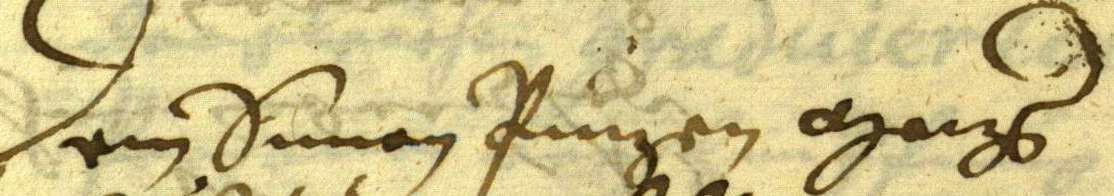Dem Simon Pinzen Mezg
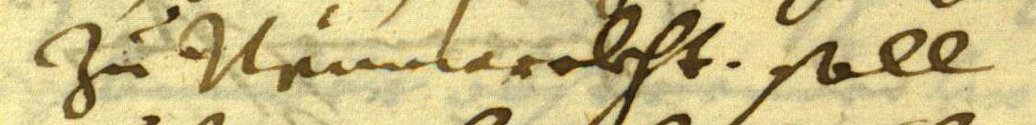Zū Neūmarckht. soll
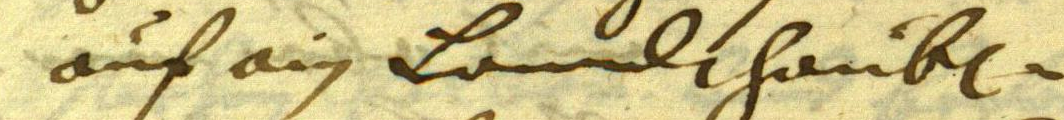aūf ain Lanndthaūbt¬
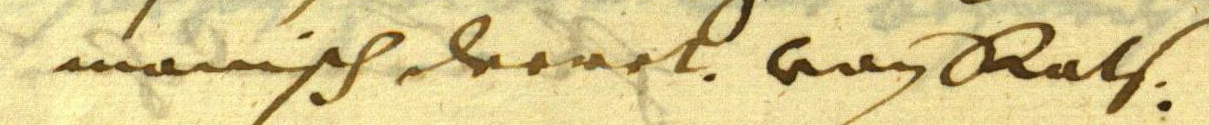manisch decret. von Rats¬
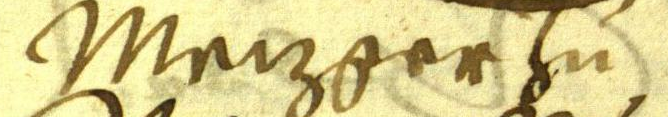Mezger Zū
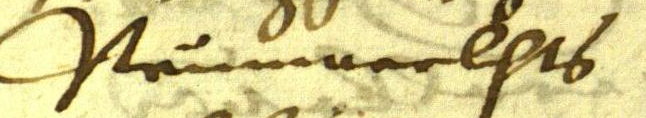Neūmarckhts
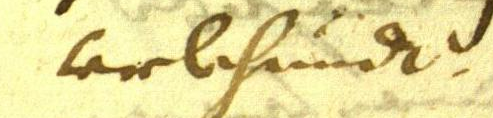vrkhūndt.
